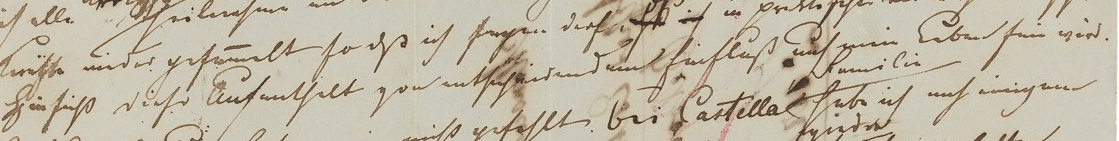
Hinsicht dieser Aufenthalt von entscheidendem Einfluß auf mein Leben sein wird.
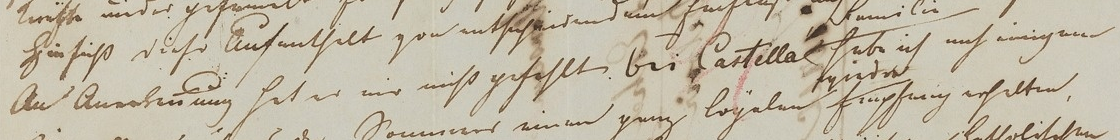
An Anerkennung hat es mir nicht gefehlt. Bei Castella'sFamilie habe ich nach einigem
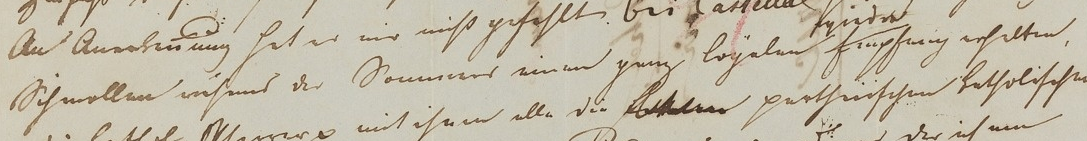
Schmollen während des Sommers einen ganz loyalen wieder Empfang erhalten,
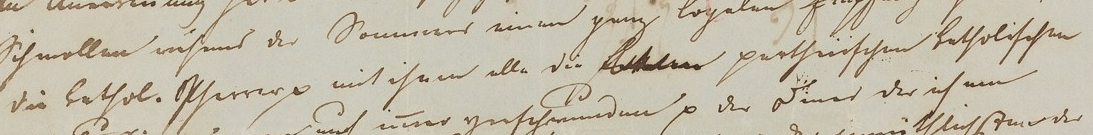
die kathol. Pfarrer & mit ihnen alle die ... partheiischen katholischen
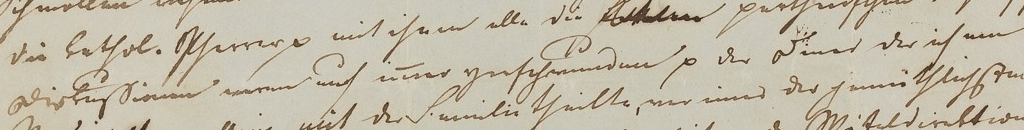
Diskußionen waren auf immer verschwunden, & das Diner das ich am
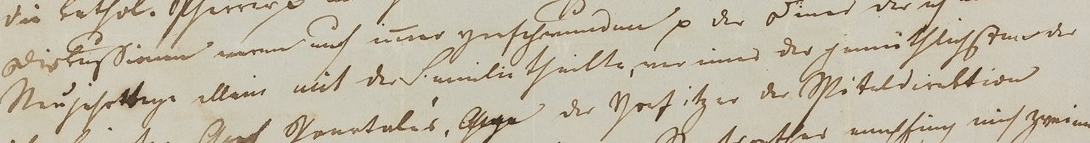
Naujahrstage allein mit der Familie theilte, war eines der gemüthlichsten das
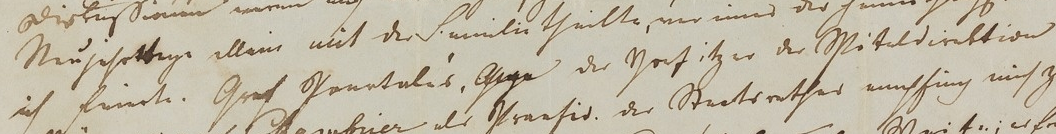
ich feierte. Graf Pourtalès, des Vorsitzer der Spitaldirektion
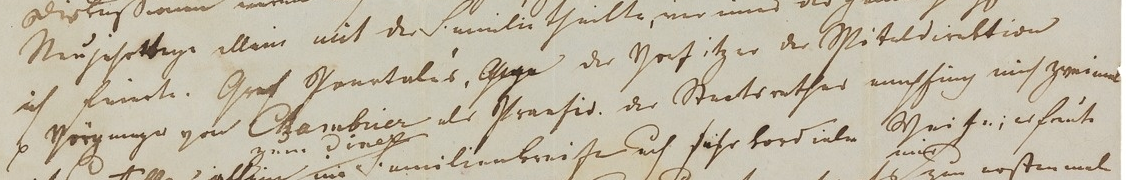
& Vorgänger von Chambrier als Praesid. des Staatsrathes empfing mich zweimal
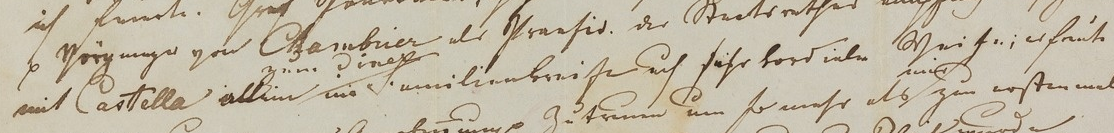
mit Castella allein zum Diner im Familienkreise auf sehr kordiale Weise; es freute
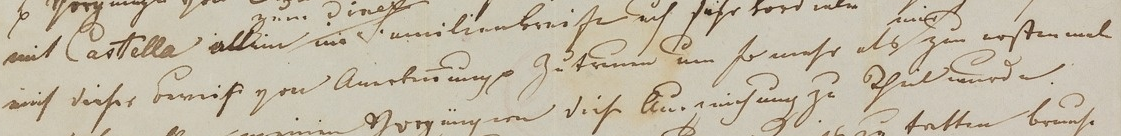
mich dieser Beweis von Anerkennung & Zutrauen um so mehr als mir zum erstenmale
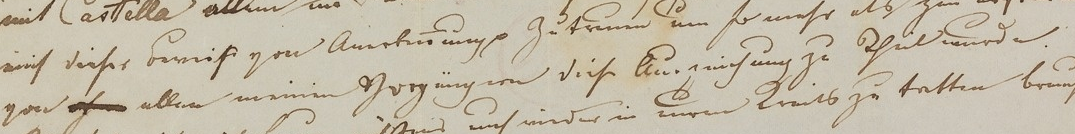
von ... allen meinen Vorgängern diese Auszeichnung zu Theil wurde.
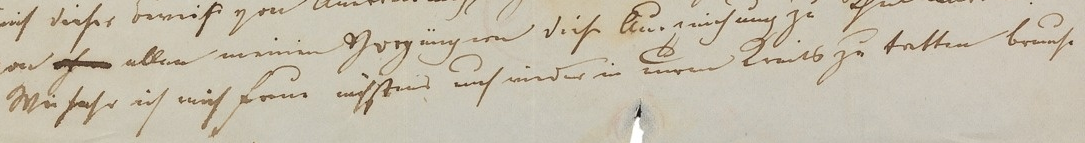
Wie sehr ich mich freue nächstens auch wieder in euren Kreis zu tretten brauche
